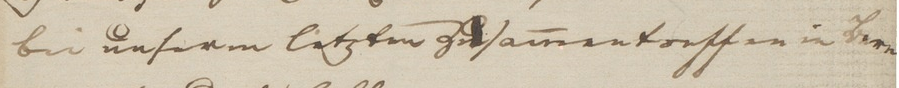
bei unserm letzten Zusammentreffen in Bern
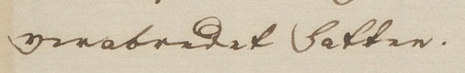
verabredet hatten.
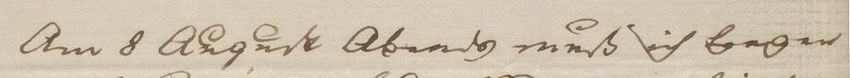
Am 8 August Abends muß ich wegen
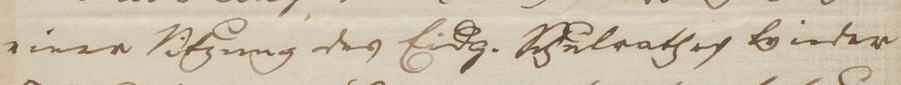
einer Sitzung des Eidg. Schulrathes wieder
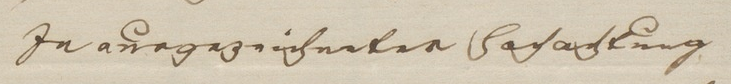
In ausgezeichneteter Hochachtung
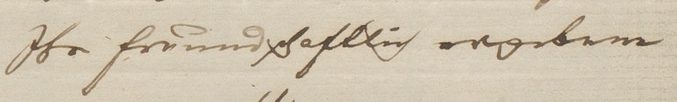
Ihr freundschafltich ergebene
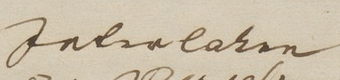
Interlaken
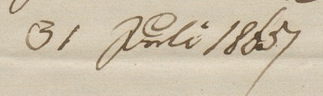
31 Juli 1865
